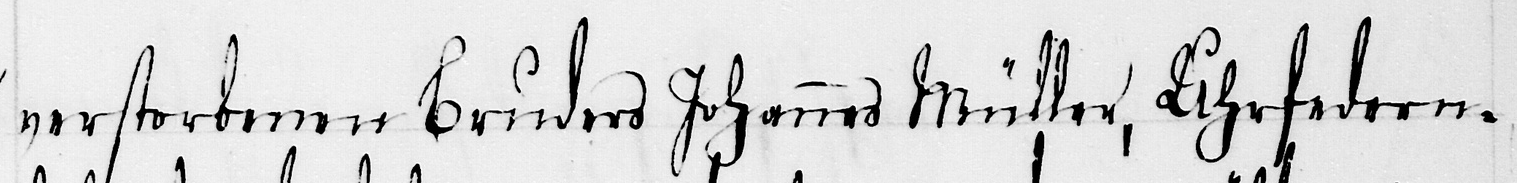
verstorbenen Bruders Johannes Müller, Uhrfedern¬
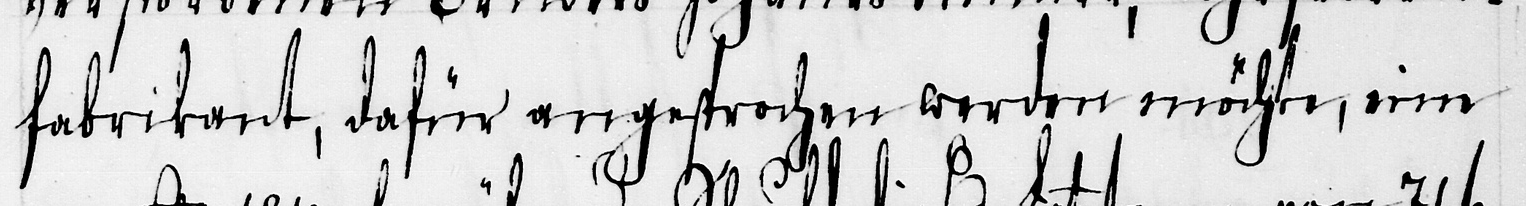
fabrikant, dafür angesprochen werden möchte, eine
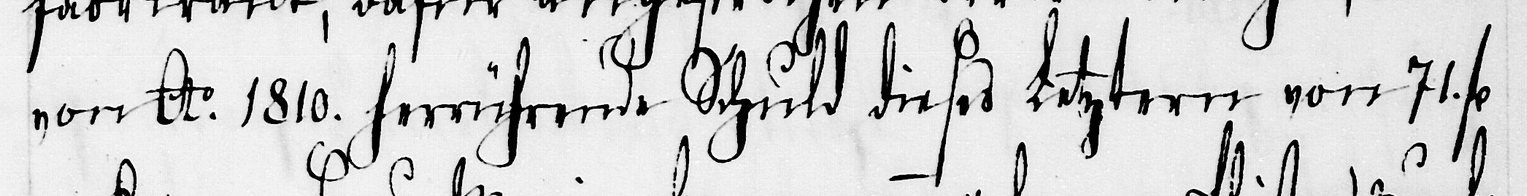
von Ao. 1810. herrührende Schuld dieses Letztern von 71.
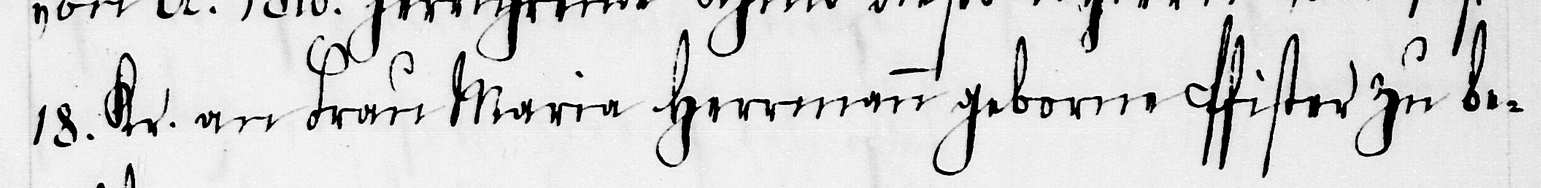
18. Kr. an Frau Maria Herrmann geborne Pfister zu be¬
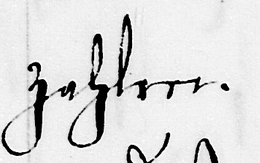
zahlen.
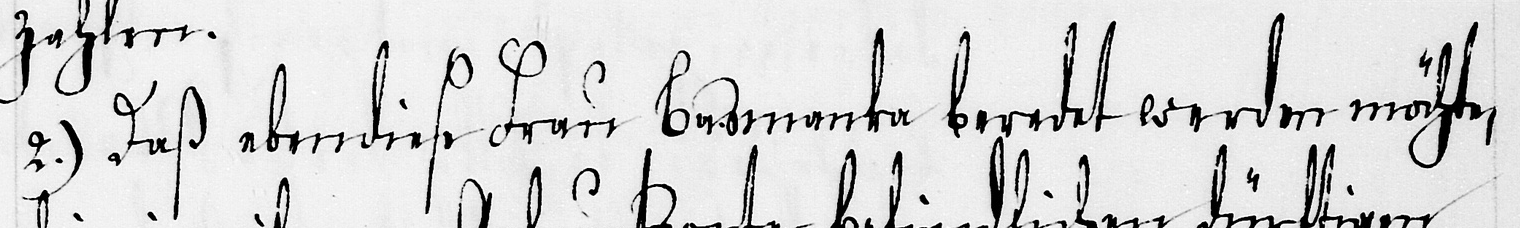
2.) Daß ebendiese Frau Basmanka beredet werden möcht¬
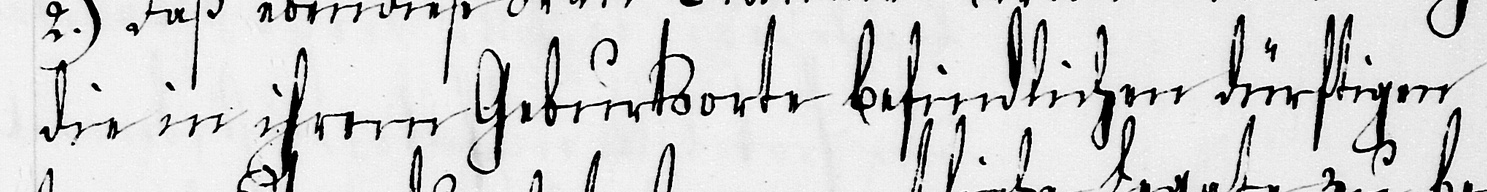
die in ihrem Geburtsorte befindlichen dürftigen
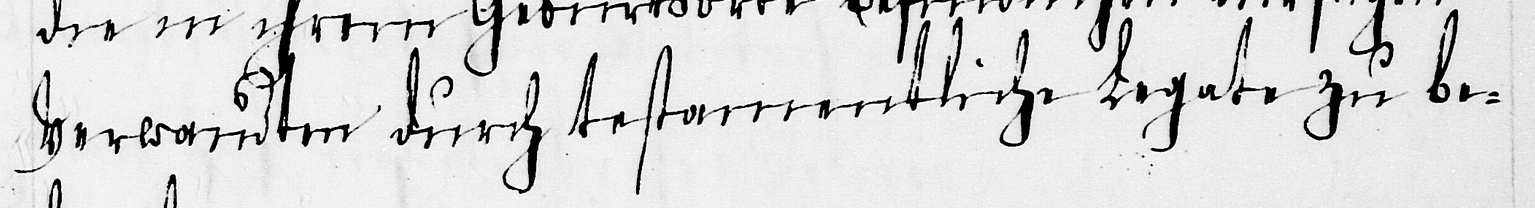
Verwandten durch testamentliche Legate zu be¬
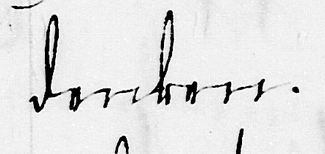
denken.
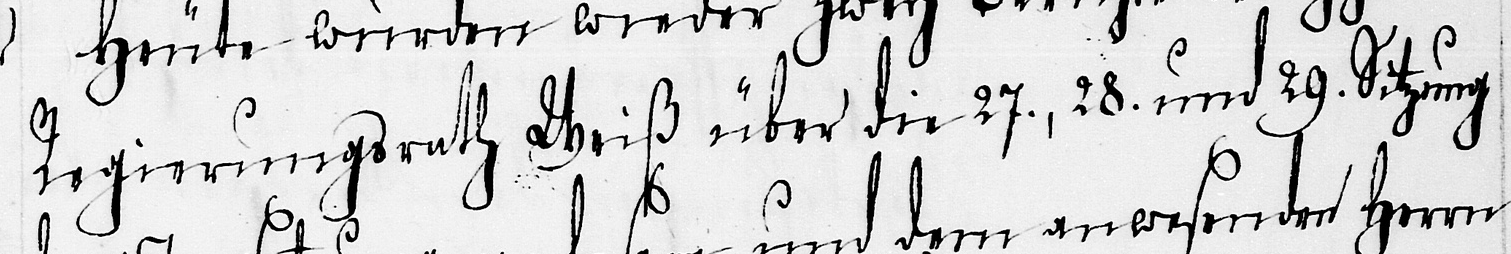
Regierungsrath Weiß über die 27., 28. und 29. Sitzung
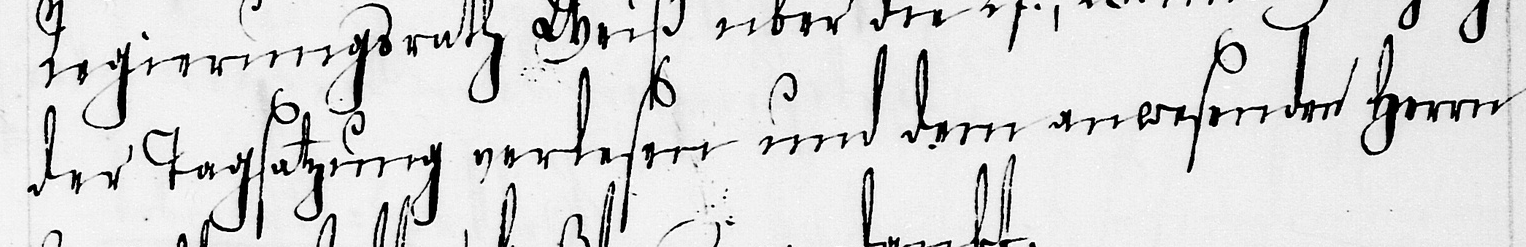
der Tagsatzung verlesen und dem anwesenden Herrn
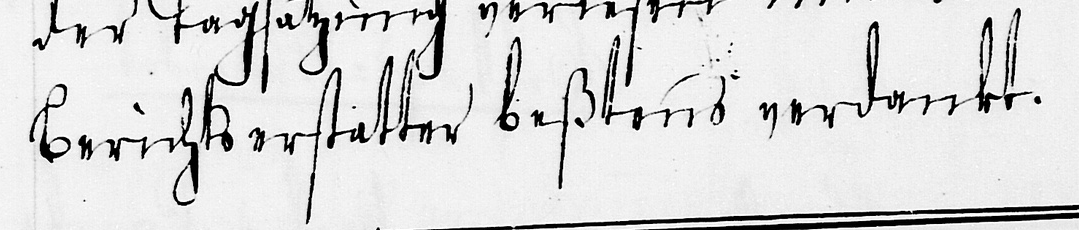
Berichtserstatter beßtens verdankt.
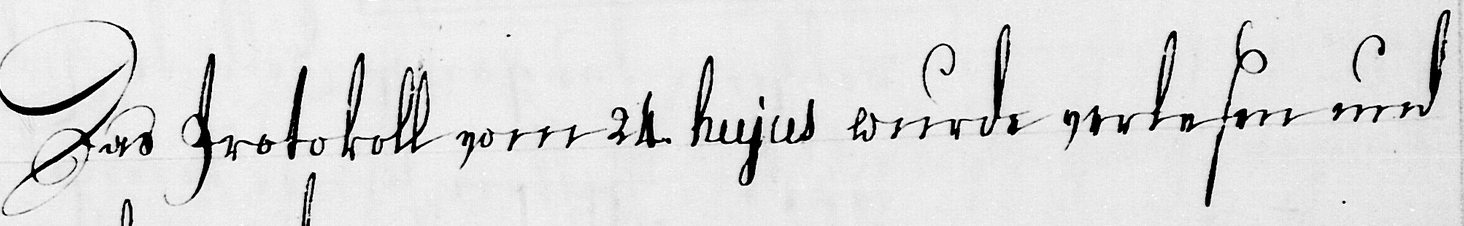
Das Protokoll vom 24. hujus wurde verlesen und
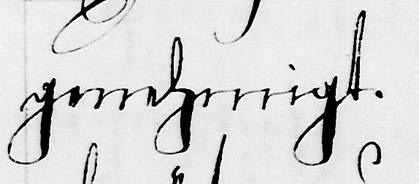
genehmigt.
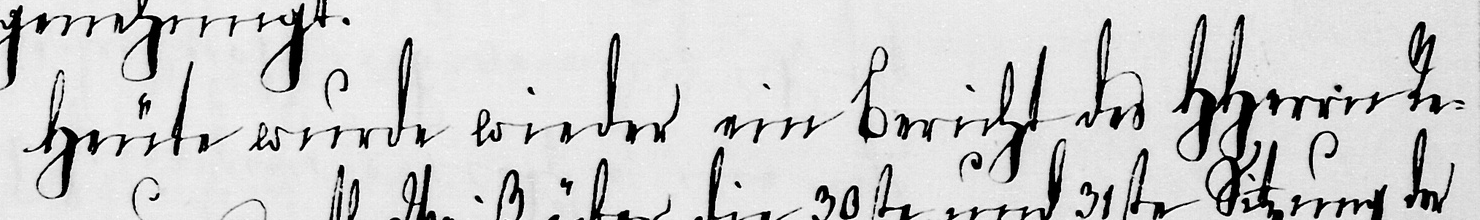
Heute wurde wieder ein Bericht des HHerrn Re¬
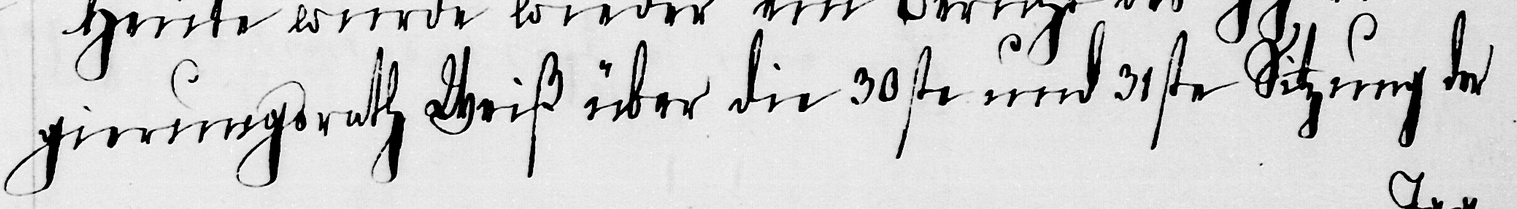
gierungsrath Weiß über die 30ste und 31ste Sitzung der
